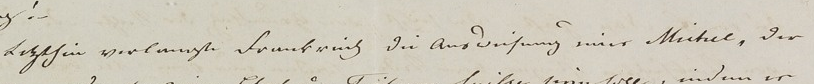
Letzthin verlangte Frankreich die Ausweisung eines Michel, der
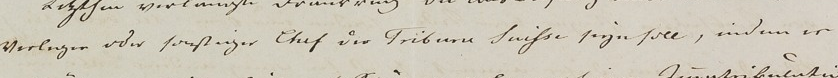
Verleger oder sonstiger Chef der Tribune Suisse seyn soll, indem es
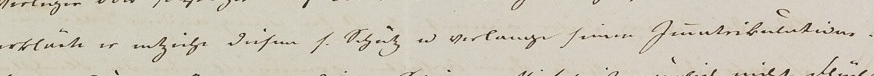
erklärte es entziehe diesem s. Schutz u verlange seinen Immatrikulations-
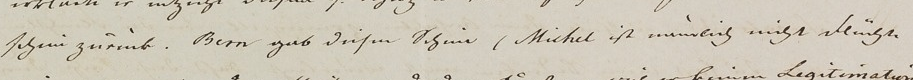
schein zurück. Bern gab diesen Schein (Michel ist nämlich nicht Flücht-
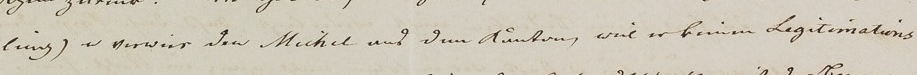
ling) u verwies den Michel aus dem Kanton, weil er keinen Legitimations
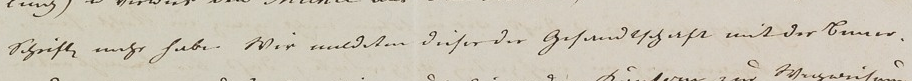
Schriften mehr habe. Wir meldeten dieses der Gesandtschaft mit der Bemer-
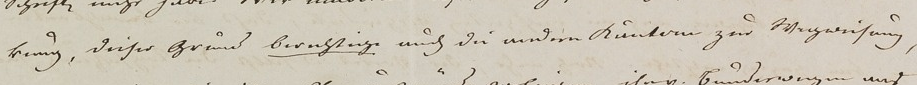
kung, dieser Grund berechtige auch die andern Kantone zur Wegweisung,
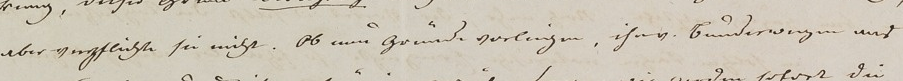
aber verpflichte sie nicht. Ob nun Gründe vorliegen, ihn v. Bundeswegen aus
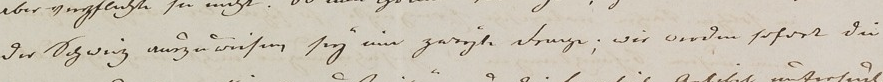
der Schweiz auszuweisen, sey eine zweyte Frage; wir werden sofort die
